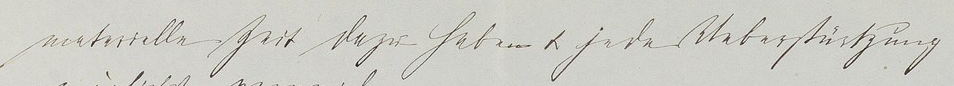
materielle Zeit dazu haben & jede Ueberstürtzung
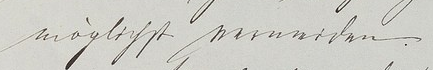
möglichst vermeiden.
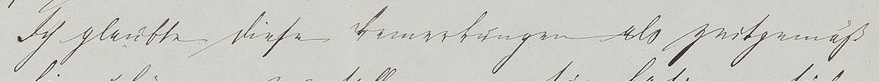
Ich glaubte diese Bemerkungen als zeitgemäß
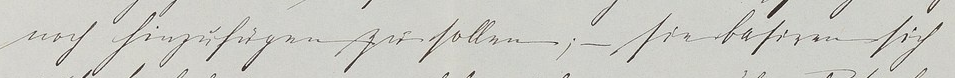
noch hinzufügen zu sollen; – sie basiren sich
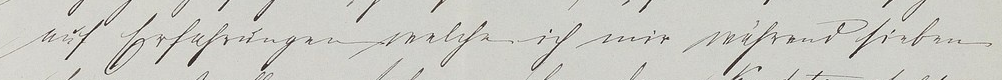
auf Erfahrungen welche ich mir während sieben
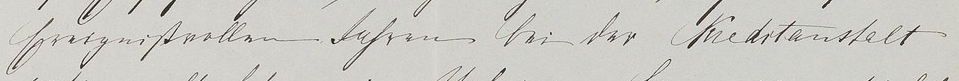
Ereignißvollen Jahren bei der Kreditanstalt
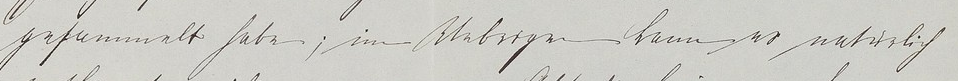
gesammelt habe; im Uebrigen kann es natürlich
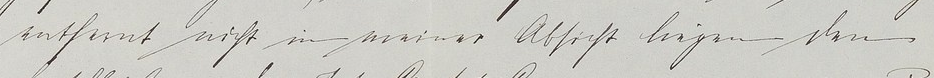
entfernt nicht in meiner Absicht liegen den
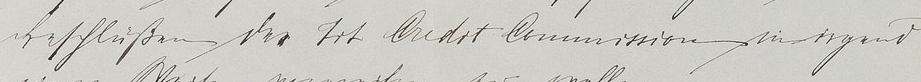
Beschlüßen der Tit Credit Commission in irgend
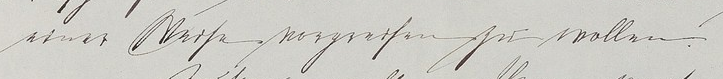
einer Weise vorgreifen zu wollen.
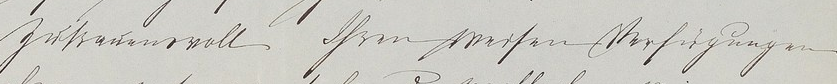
Zutrauensvoll Ihren weisen Verfügungen
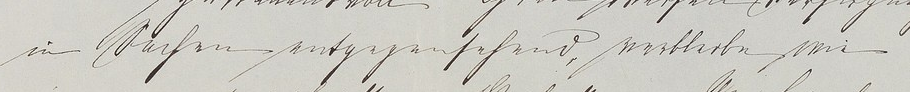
in Sachen entgegensehend, verbleibe wie
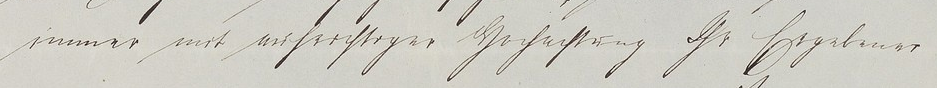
immer mit aufrichtiger Hochachtung Ihr Ergebener
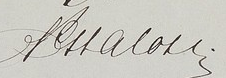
Pestalozzi.
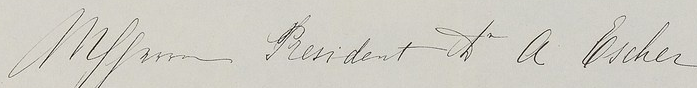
Mhherrn President Dr A. Escher
